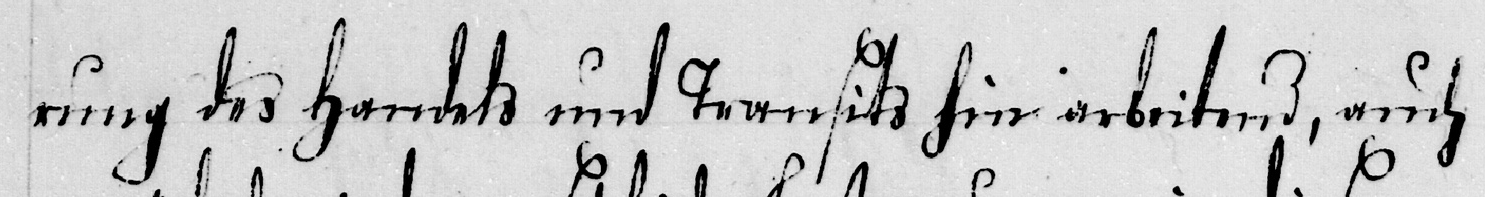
rung des Handels und Transits hin arbeitend, auch
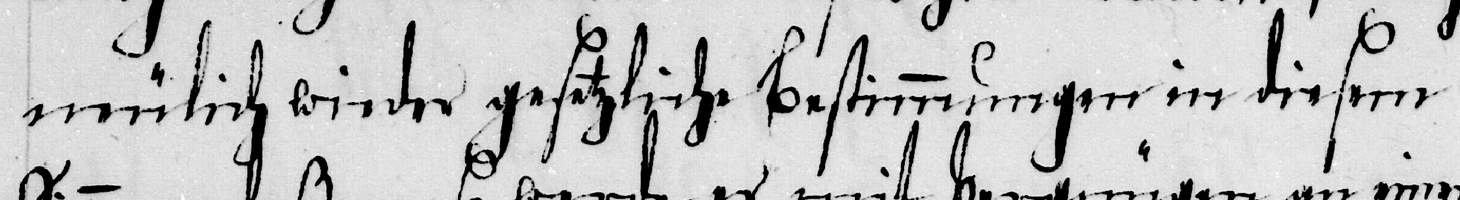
neulich wieder gesetzliche Bestimmungen in diesem
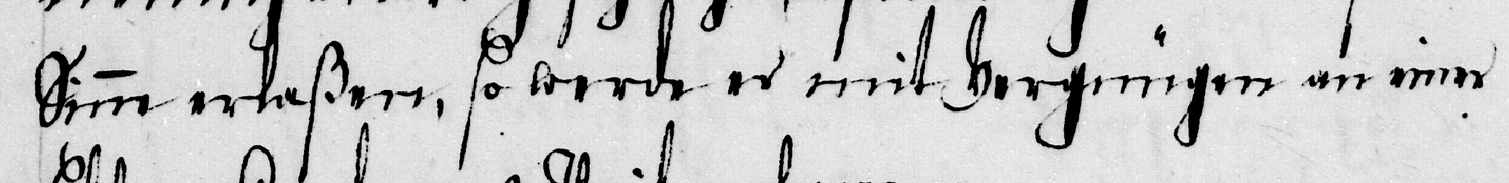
Sinn erlaßen, so werde er mit Vergnügen an einer
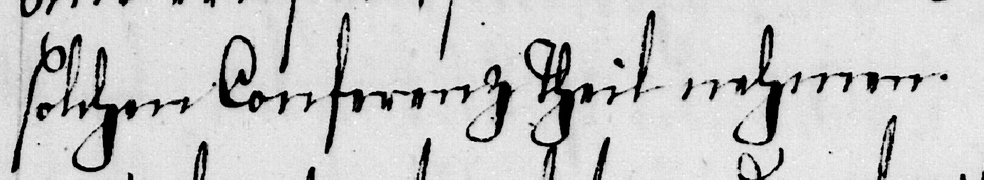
solchen Conferenz Theil nehmen.
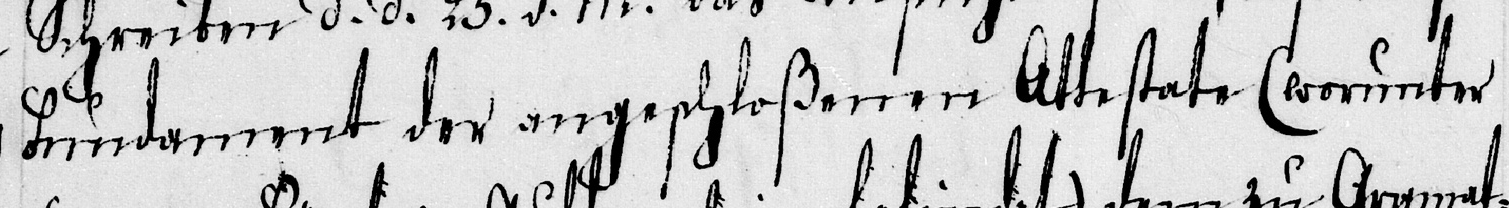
Fundament der angeschloßenen Attestate (worunter
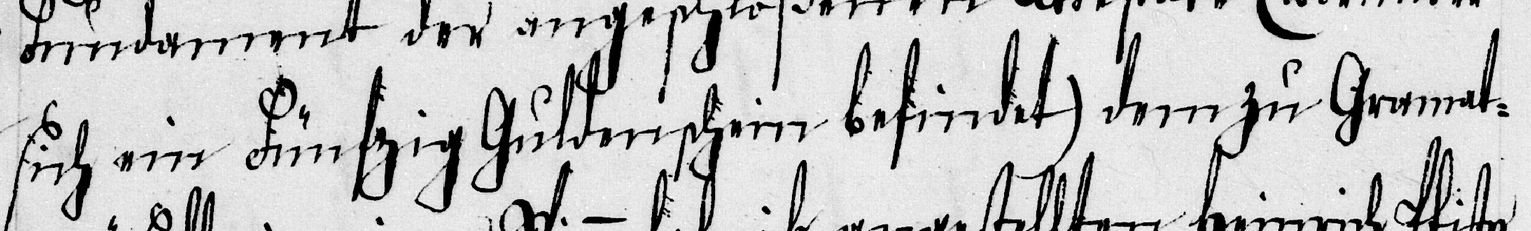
sich ein Fünfzig Guldenschein befindet) dem zu Gramat¬
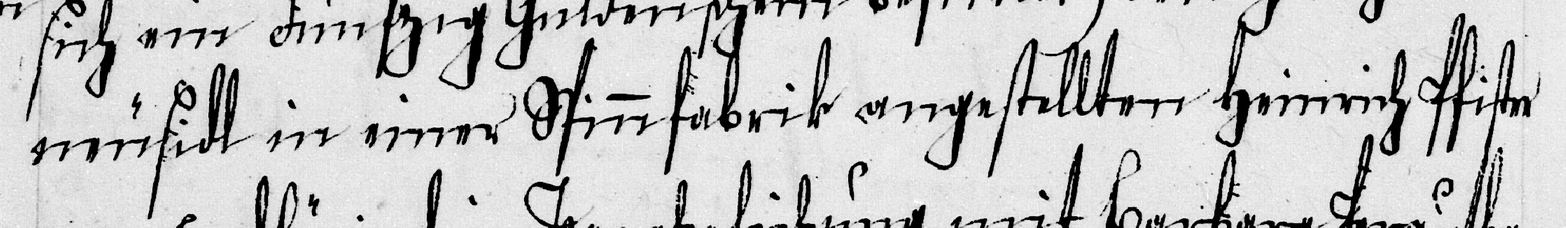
neusidl in einer Spinnfabrik angestellten Heinrich Pfister
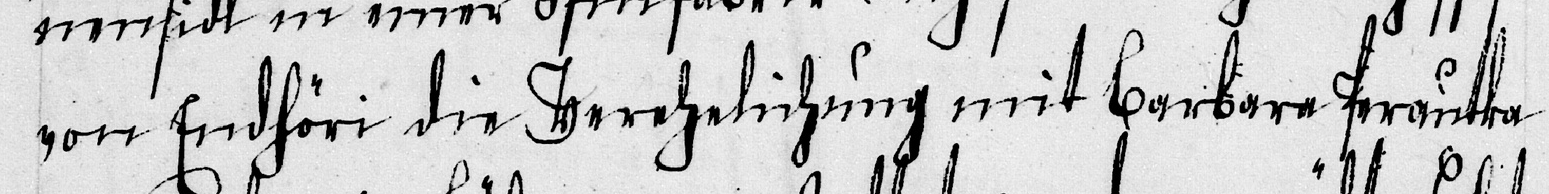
von Endhöri die Verehelichung mit Barbara Perautka
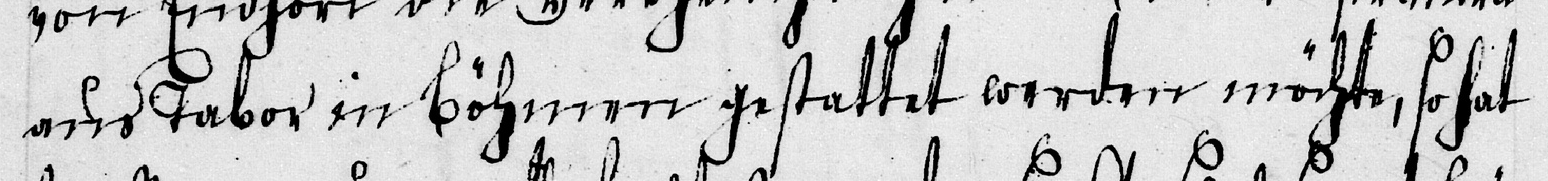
aus Tabor in Böhmen gestattet werden möchte, so hat
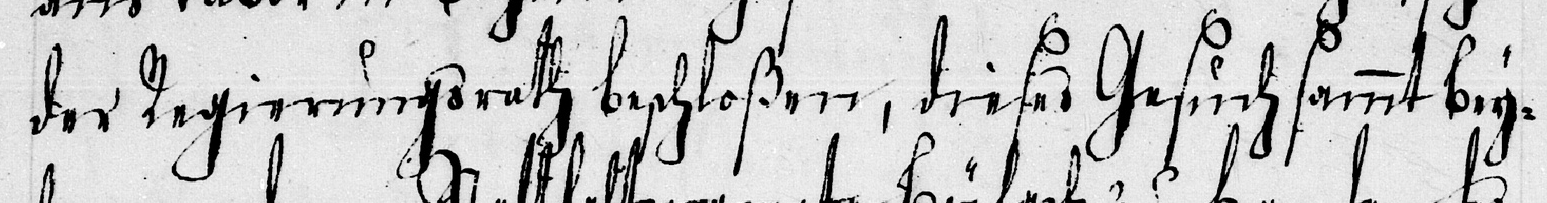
der Regierungsrath beschloßen, dieses Gesuch sammt Bey¬
